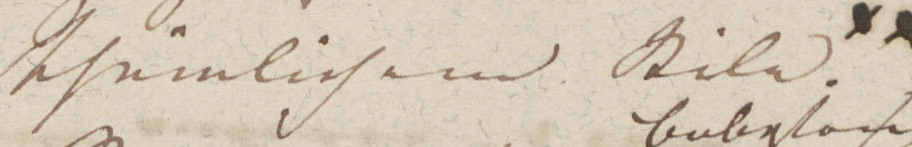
thümlichem Stile. %
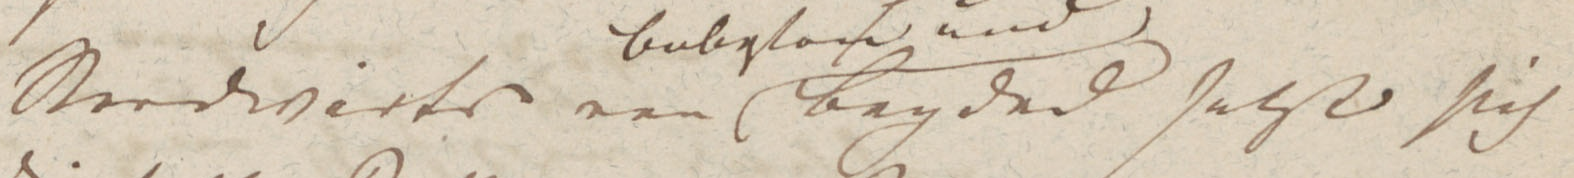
Nordwärts von Babylon und Bagdad setzt sich
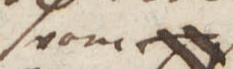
von Ruinenbergen
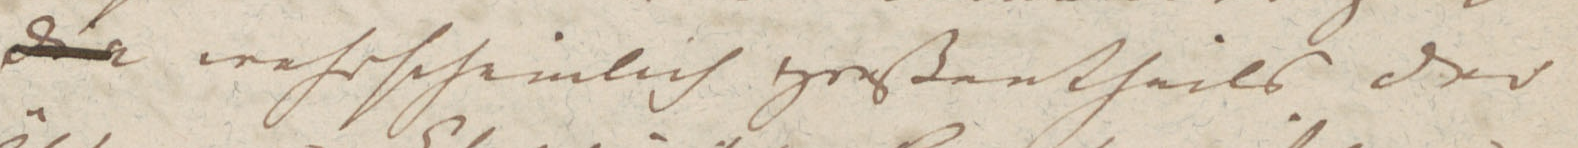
d wahrscheinlich grossentheils der
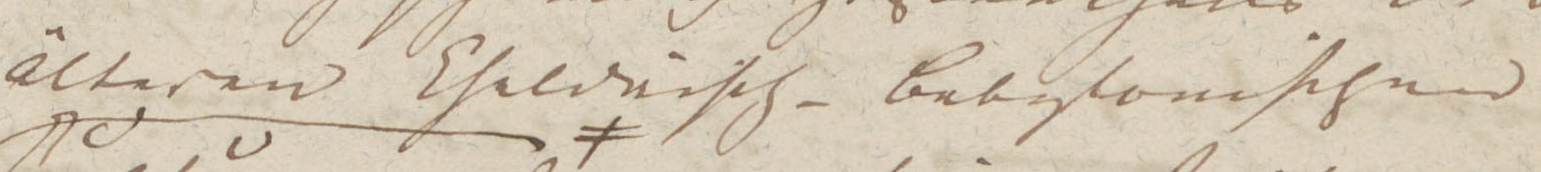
älteren Chaldäisch-Babylonischen
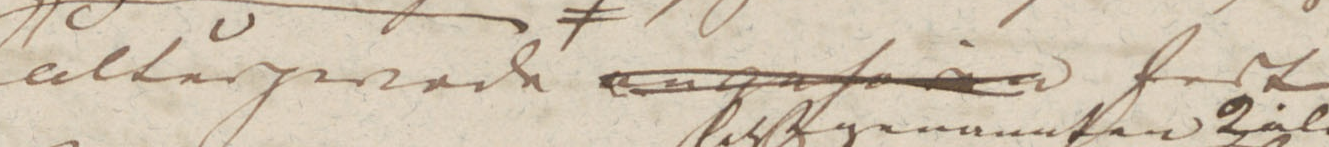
Culturperiode %% angehören fort.
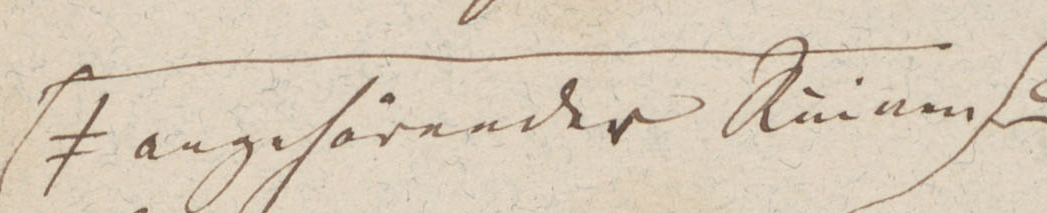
% % angehörender Ruinen-
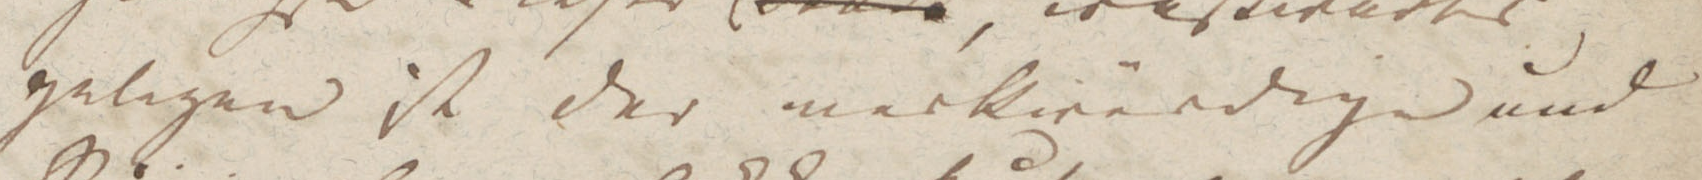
gelegen ist der merkwürdige und
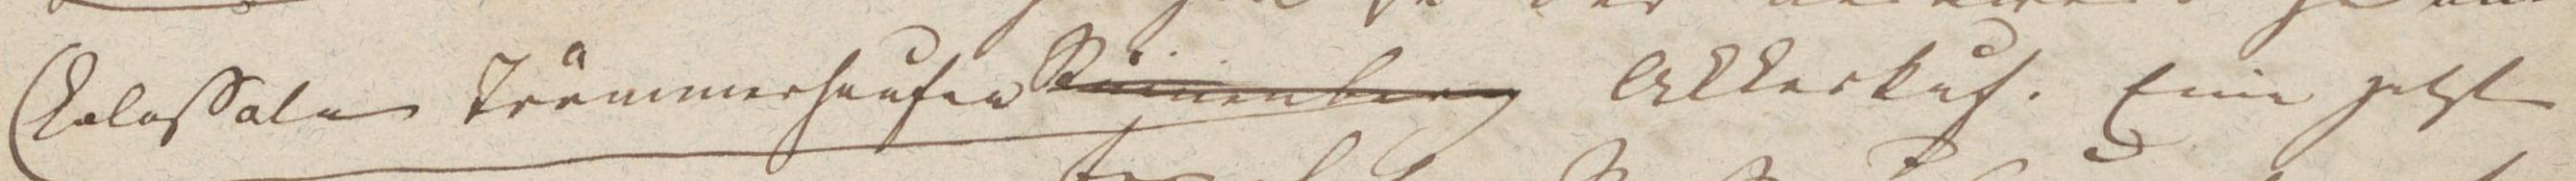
kolossale Trümmerhaufen Ruinenberg Akkerkuf. Eine jetzt
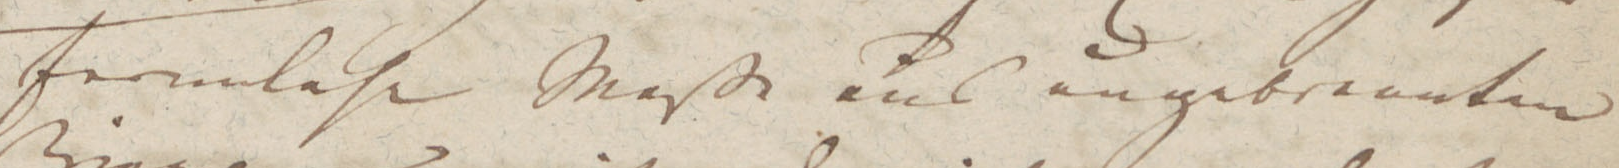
formlose Masse aus ungebrannten
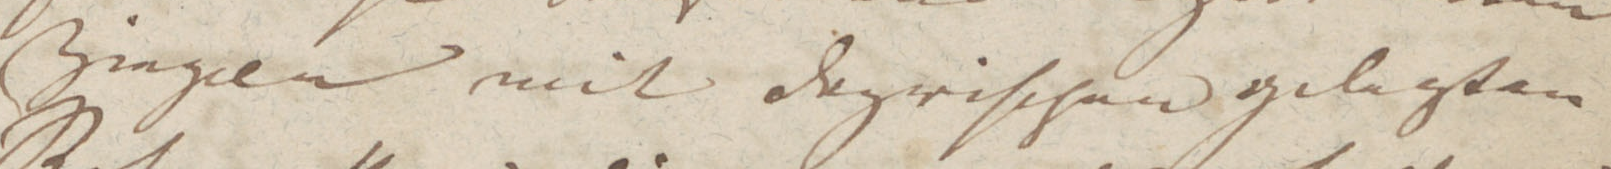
Ziegeln mit dazwischen gelegten
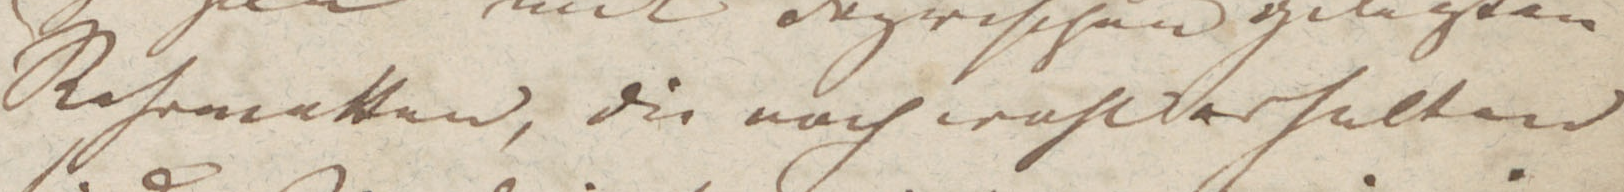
Rohrmatten, die noch wohl erhalten
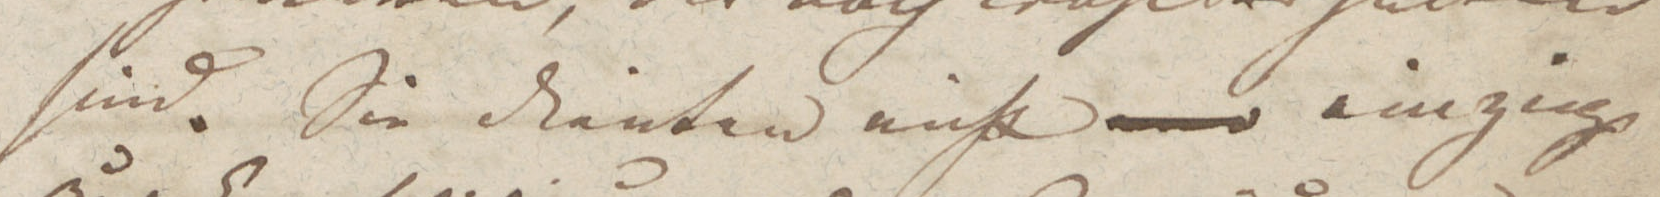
sind. Sie dienten nicht einzig
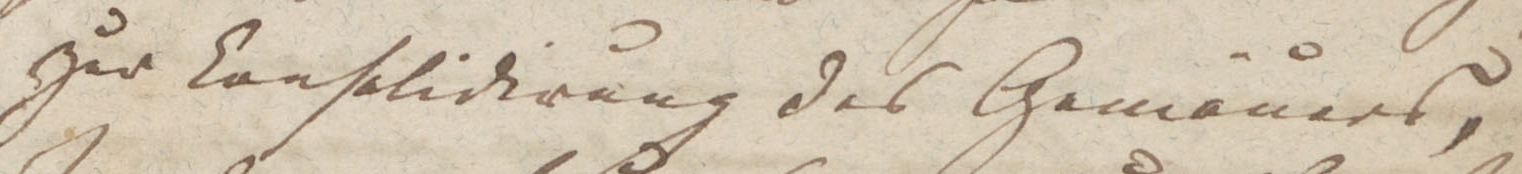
zur Consolidirung des Gemäuers,
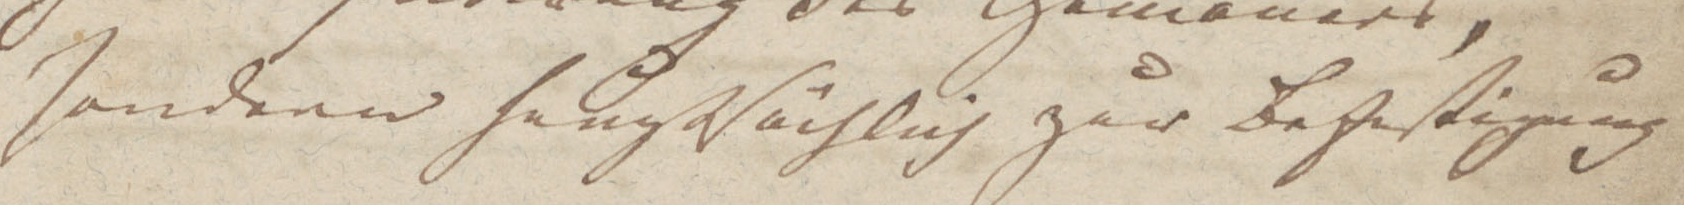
sondern hauptsächlich zur Befestigung
